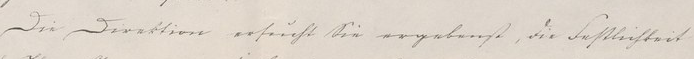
Die Direktion ersucht Sie ergebenst, die Festlichkeit
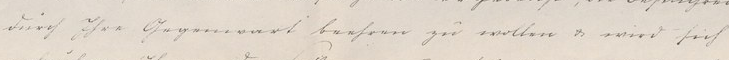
durch Ihre Gegenwart beehren zu wollen & wird sich
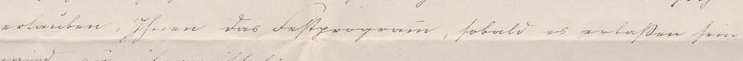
erlauben, Ihnen das Festprogramm, sobald es erlassen sein
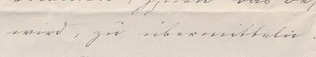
wird, zu übermitteln.
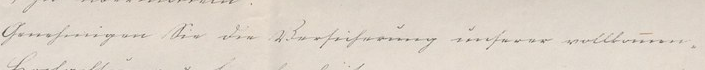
Genehmigen Sie die Versicherung unserer vollkommen-
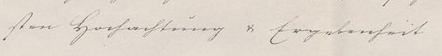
sten Hochachtung & Ergebenheit
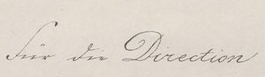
Für die Direction
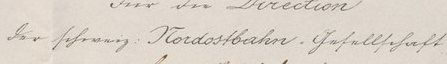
der schweiz. Nordostbahn-Gesellschaft
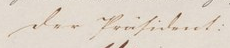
der Präsident:
